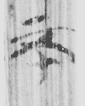不
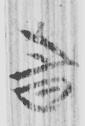{屮日}
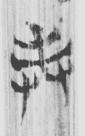奉
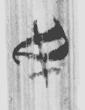民
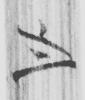之
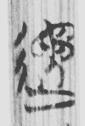{辶矛人}
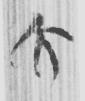大
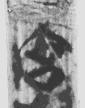宮
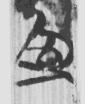室
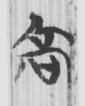高
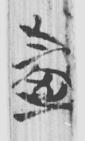{之室}
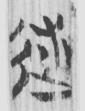述
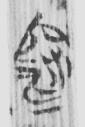深
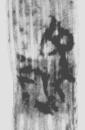沱
